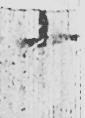七
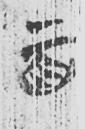百
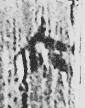六
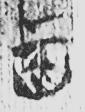百
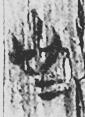卅=
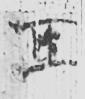五
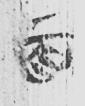百
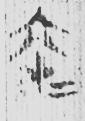六十=
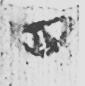四
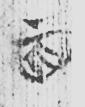百
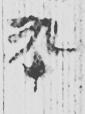{九十}
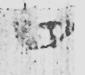四
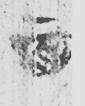百
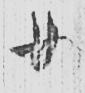廿
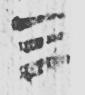三
